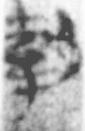韌
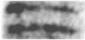二
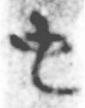屯
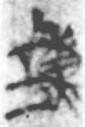○（纁）
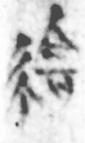○（組）
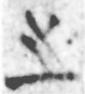之
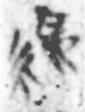綏
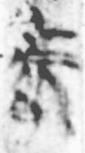○（虎）
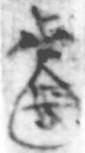○（韔）
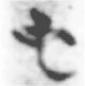屯
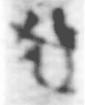狐
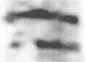二
